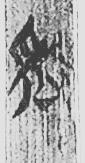{爰攴}
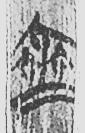齊
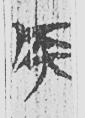侯
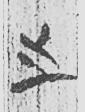之
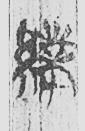{糸帶}
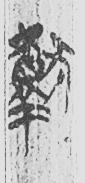獻
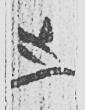之
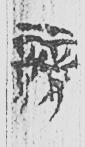競
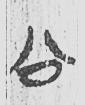公
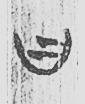曰
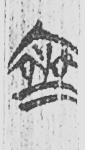齊
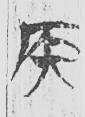侯
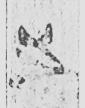之
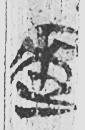麥
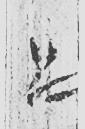也
